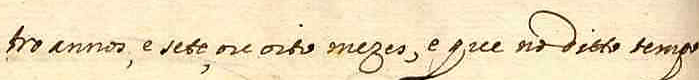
tro annos, e sete, ou oito mezes, e que no ditto tempo
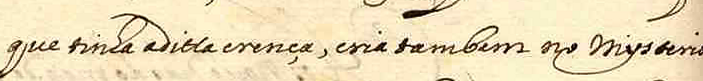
que tinha a ditta crença, cria tambem no mysterio
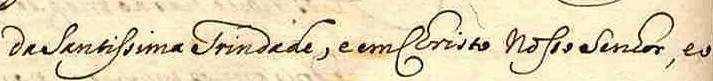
da Santissima Trindade, e em Christo nosso Senhor, e o
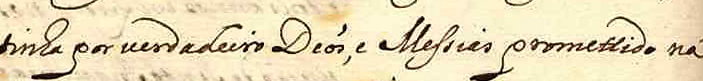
tinha por uerdadeiro Deōs, e Messias promettido na
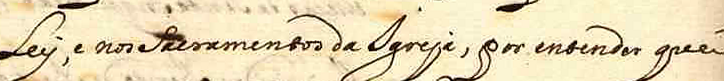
Ley, e nos Sacramentos da Jgreja, por entender que
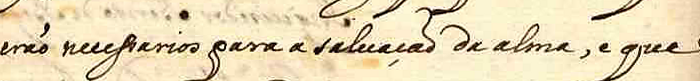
erão necessarios para a saluaçaõ da alma, e que
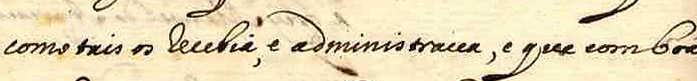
como tais os recebia, e administraua, e que com boā
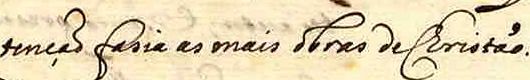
tençaõ fasia as mais obras de Christão?
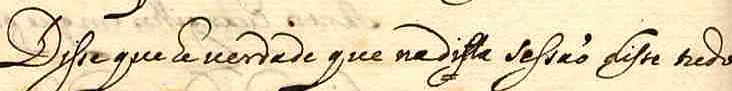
Disse que he verdade que na ditta sessão disse tudo
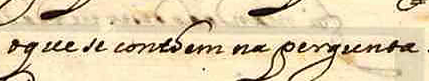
o que se conthem na pergunta.
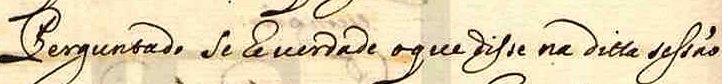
Perguntado se he uerdade o que disse na ditta sessão
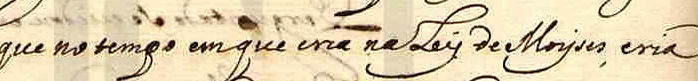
que no tempo em que cria na Ley de Moyses, cria
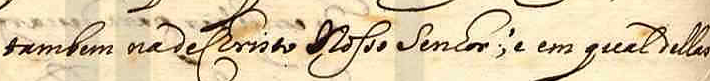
tambem na de Christo nosso Senhor; e em qual dellas
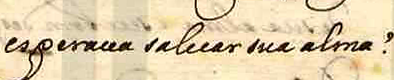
esperaua saluar sua alma?
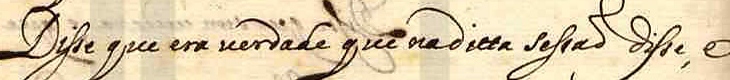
Disse que era verdade que na ditta sessaõ disse, e
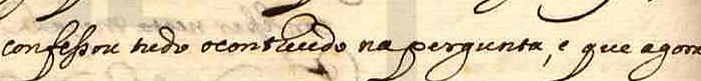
confessou tudo o contheudo na pergunta, e que agora
